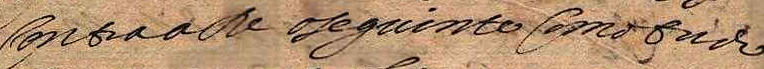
Contra a Re o seguinte Como tudo
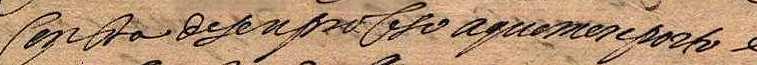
Consta de seu proCeso a que me reporto e
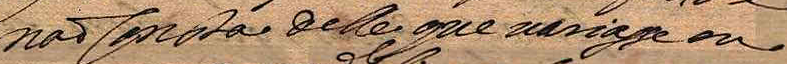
não Consta delle que uariasse ou
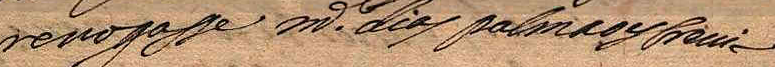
reuogasse mel. dias palma o escreui
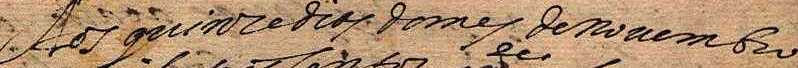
Aos quinze dias do mes de nouembro
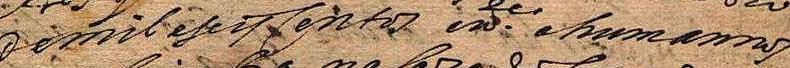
de mil e seisCentos e ute. e hum annos
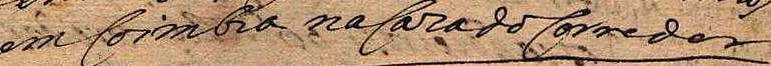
em Coimbra na Caza do Corredor
